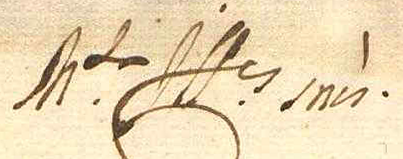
M.to Ill.es snrs̄.
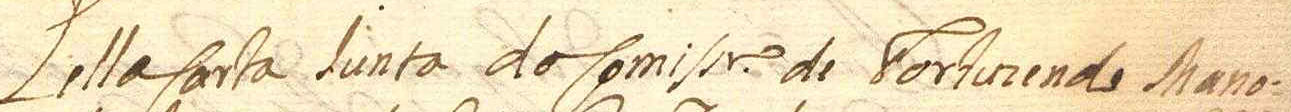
Pella Carta Iunta do Comissr.o de Tortezendo Mano
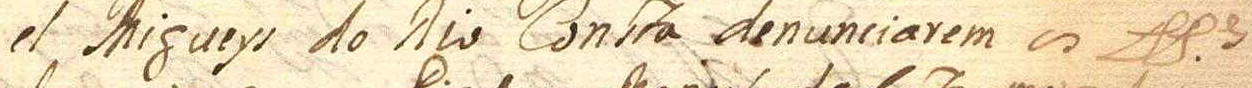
el Migueys do Rio Consta denunciarem os PP.es
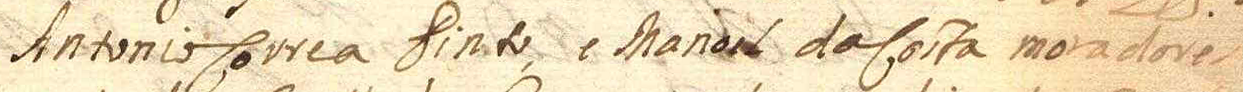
Antonio Correa Pinto, e Manoel da Costa moradores
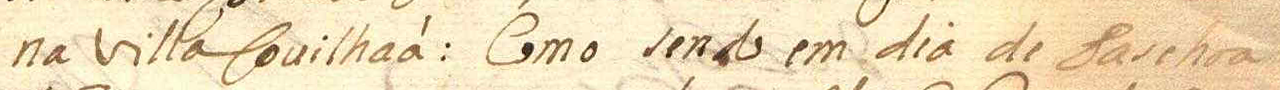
na villa Couilhaā: Como sendo em dia de Paschoa
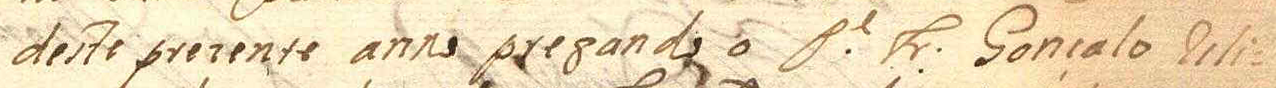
deste prezente anno pregando o P.e Fr. Gonçalo Reli
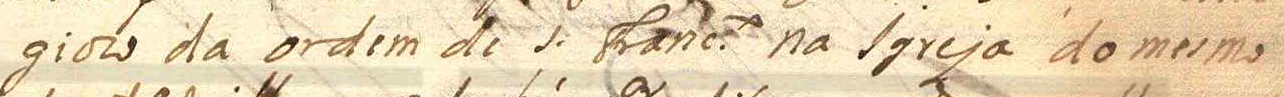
giozo da ordem de s. Franc.o na Igreja do mesmo
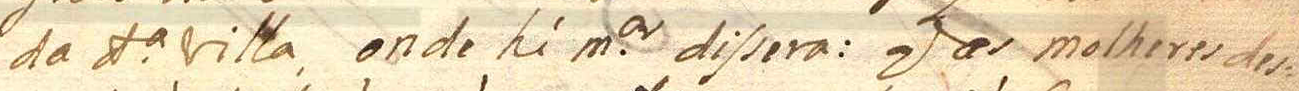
da d̄.a villa, onde hé m.or dissera: q̄ as molheres des
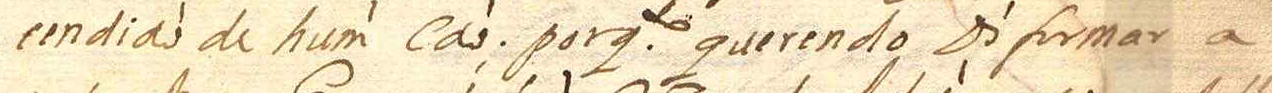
cendiaõ de hum̄ caõ; porq.to querendo Ds̄ formar a
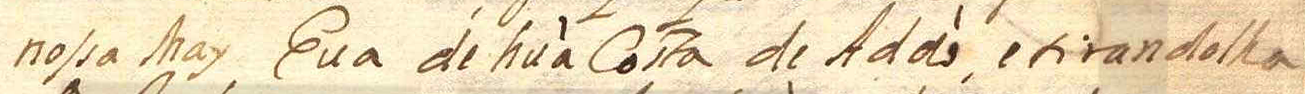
nossa May Eua de huā Costa de Adão, e tirandolha
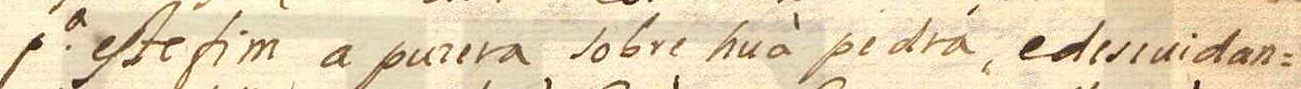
p.a este fim a puzera sobre huā pedra, e descuidan
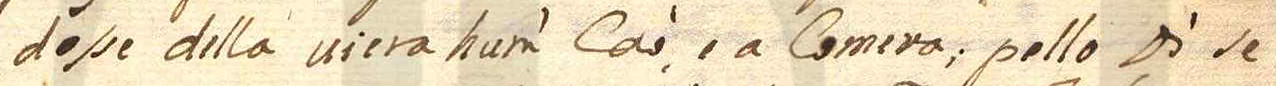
dosse della uiera hum̄ Caõ, e a Comera, pello Ds̄ se
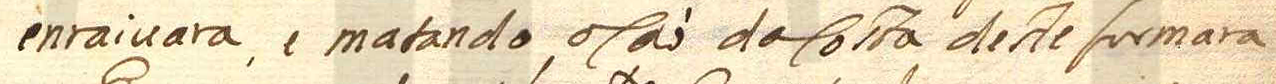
enraiuara, e matando o Caõ da Costa de deformara
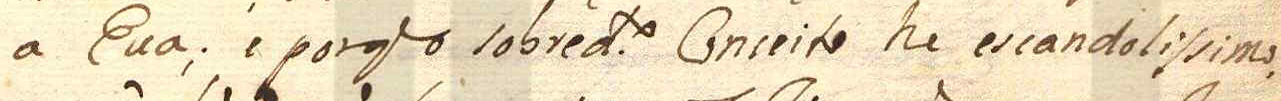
a Eua; e porq̄ o sobred̄.o Conceito he escandolissimo,
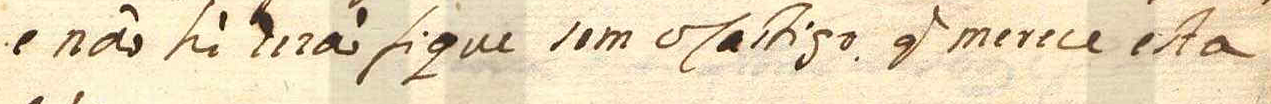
e não hé rezaõ fique sem o Castigo q̄ merece esta
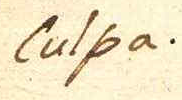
culpa.
